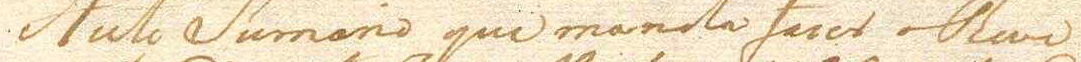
Auto Sumario que manda fazer o Reve
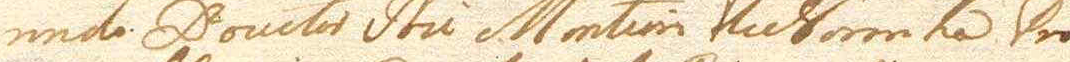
rendo Doutor Iosé Martins de Noronha Pro
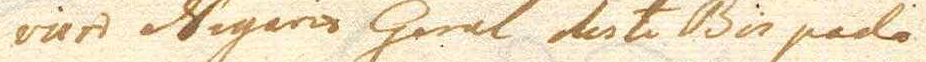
visor e Vigario Geral deste Bispado
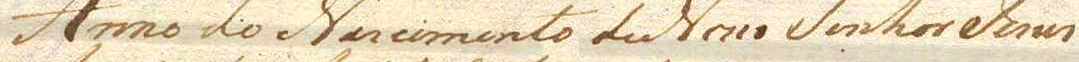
Anno do Nascimento de Nosso Senhor Iesus
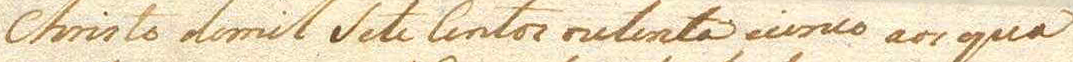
Christo de mil SeteCentos outenta e cinco aos qua
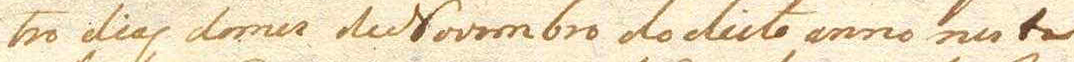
tro dias do mes de Novembro do dicto anno nesta
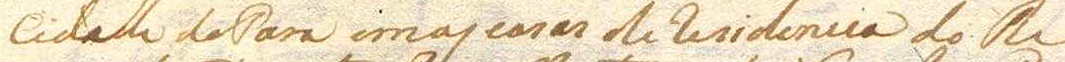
Cidade do Para em as casas de Residencia do Re
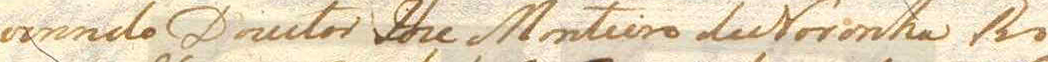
verendo Doutor Iose Monteiro de Noronha Pro
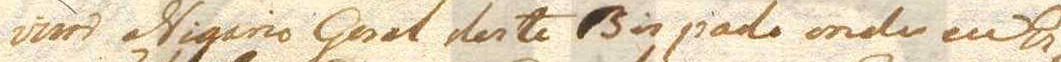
visor o Vigario Geral deste Bispado onde eu Es
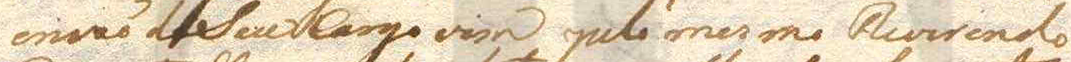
crivaõ de Seu Cargo vim pelo mesmo Reverendo
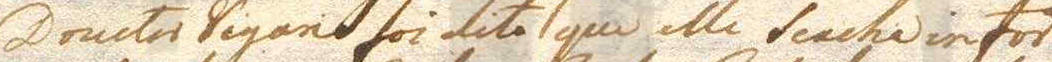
Douctor Vigario foi dito que elle Se acha infor
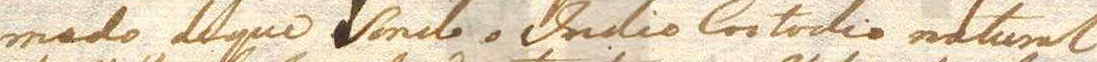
mado de que Sendo o Indio Costodio natural
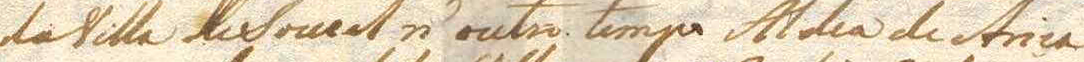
da Villa de Soucel n'outro tempo Aldea de Arira
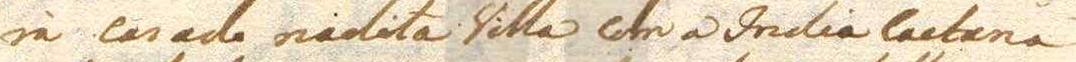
rá casado na dita Villa com a India Caetana
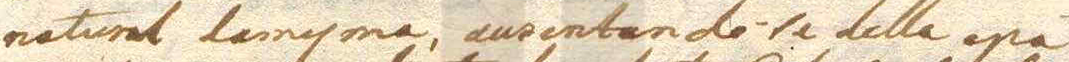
natural da mesma, ausentando-se della e pa
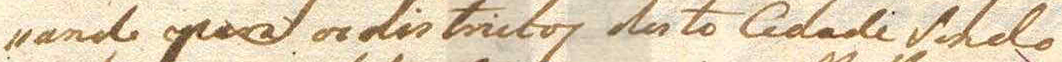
ssando para os districtos desto Cidade Sendo
